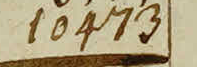10473
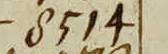8514
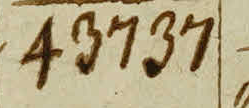43737
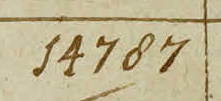14787
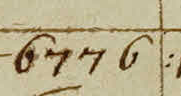6776
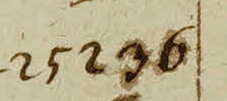25236
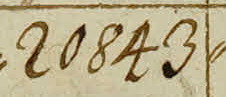20843
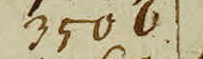3506
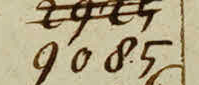9085
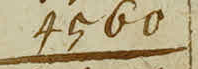4560
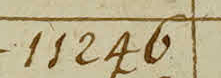11246
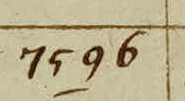7596
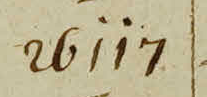26117
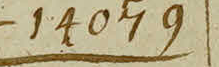14079
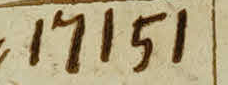17151
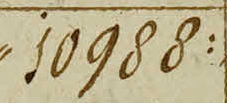10988
